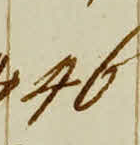46
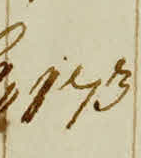173
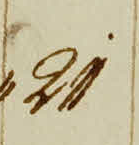21
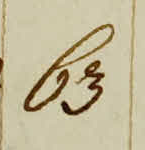63
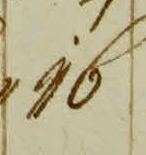16
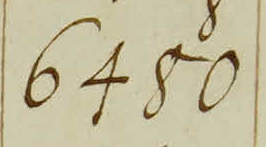6480
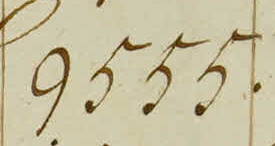9555
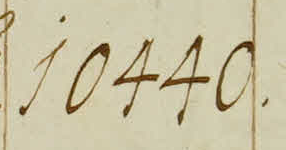10440
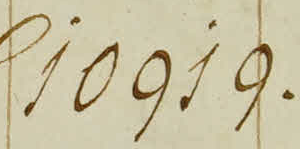10919
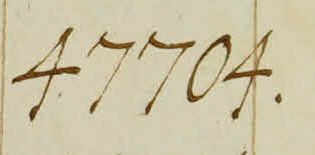47704.
